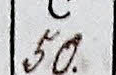50.
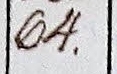64.
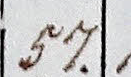57.
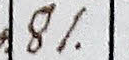81.
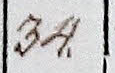34.
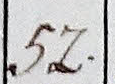52
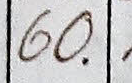60.
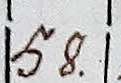58.
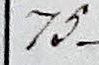75
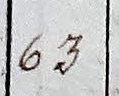63
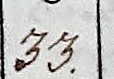33.
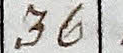36
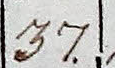37.
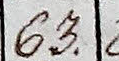63.
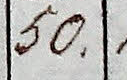50.
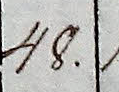48.
